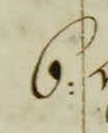6:
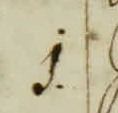1.
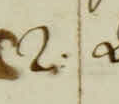2:
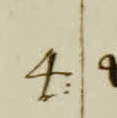4:
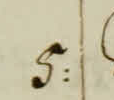5:
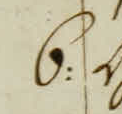6:
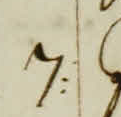7:
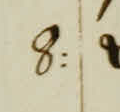8:
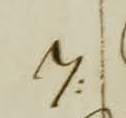7:
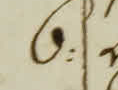6:
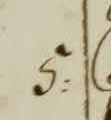5:
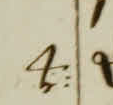4:
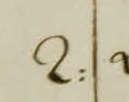2:
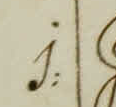1:
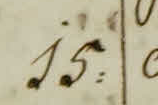15:
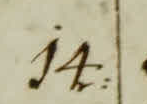14:
